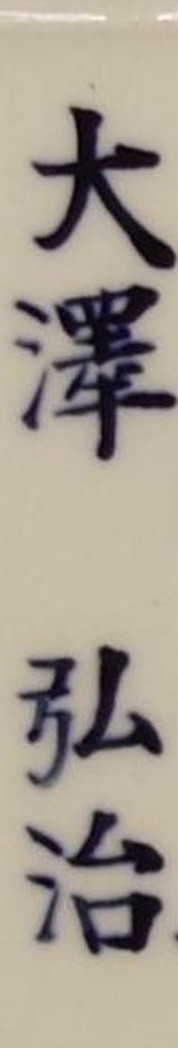大澤弘治

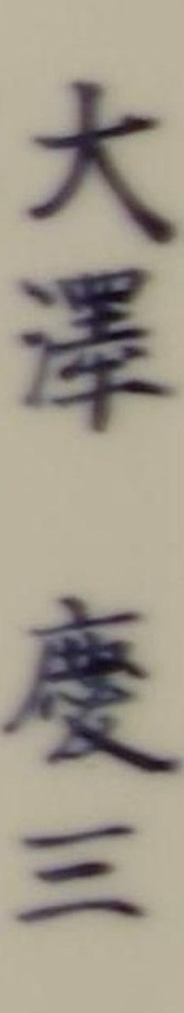大澤慶三
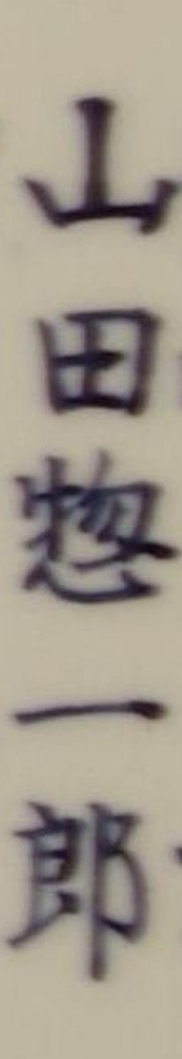山田惣一郎
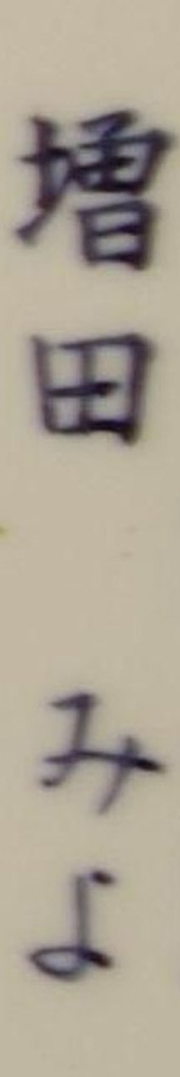増田みよ
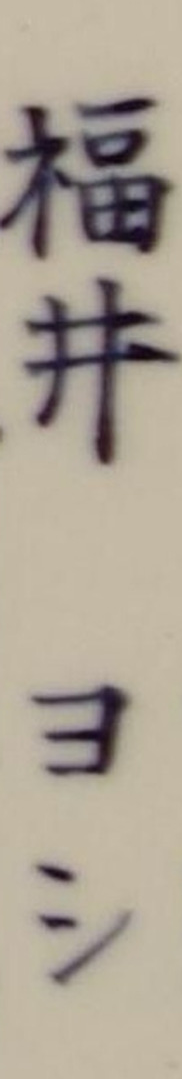福井ヨシ
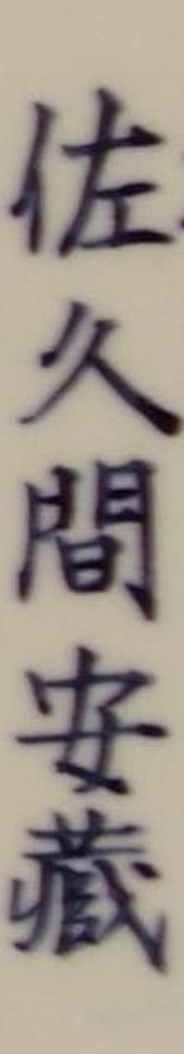佐久間安蔵
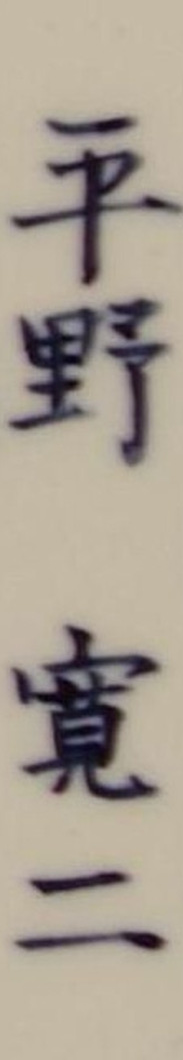平野寛二
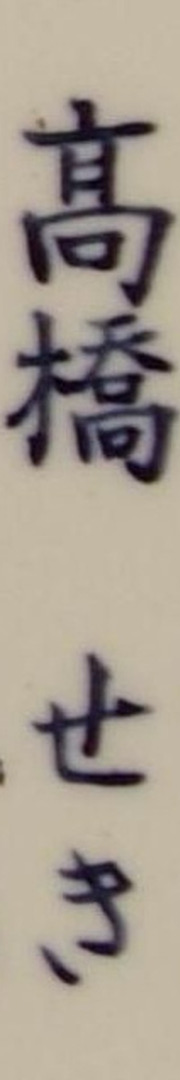高橋せき
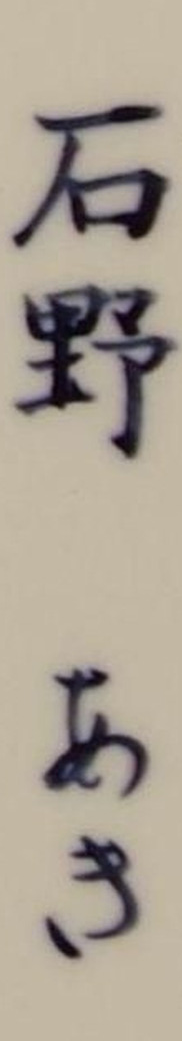石野あき
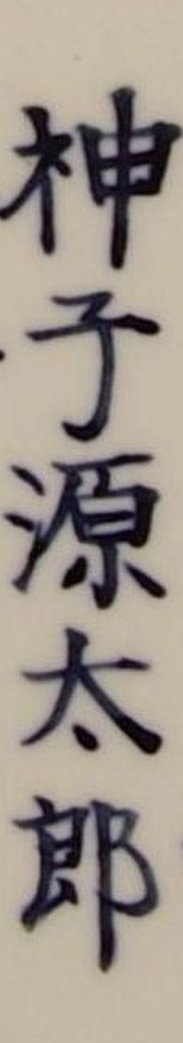神子源太郎
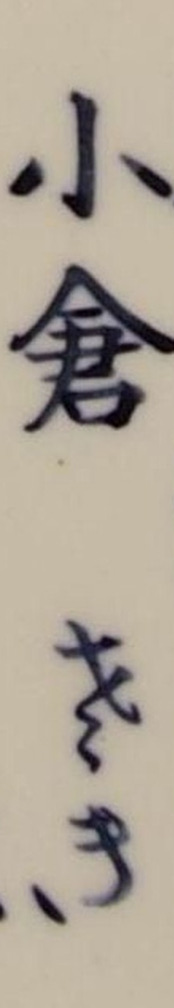小倉さき
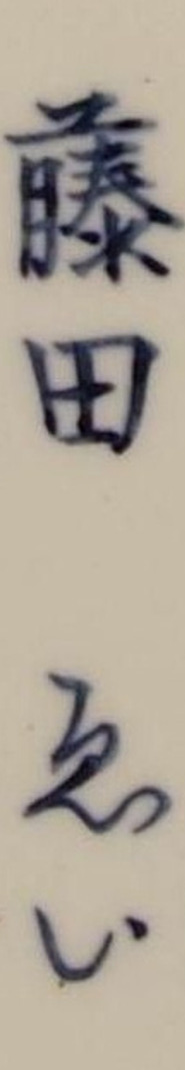藤田えい
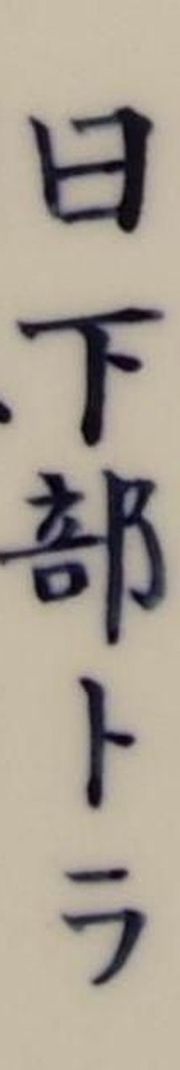日下部トラ
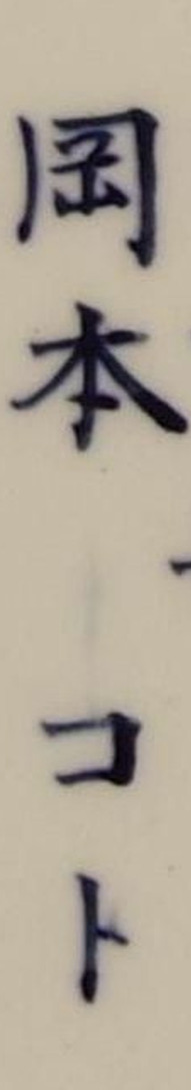岡本コト
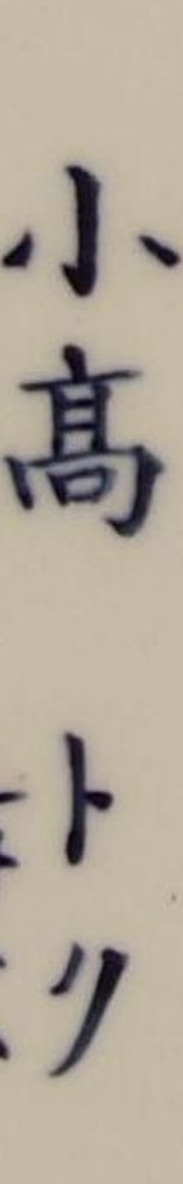小高トク
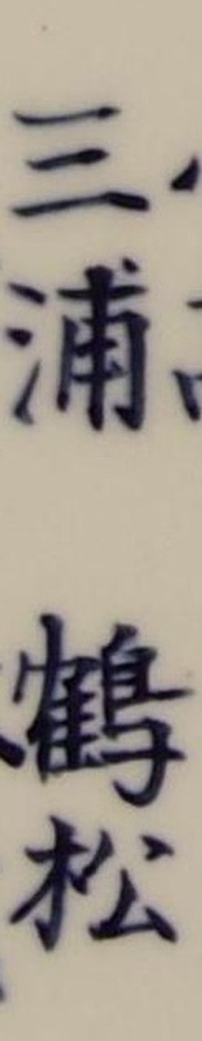三浦鶴松
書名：E~L
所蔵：高野山金剛峯寺
